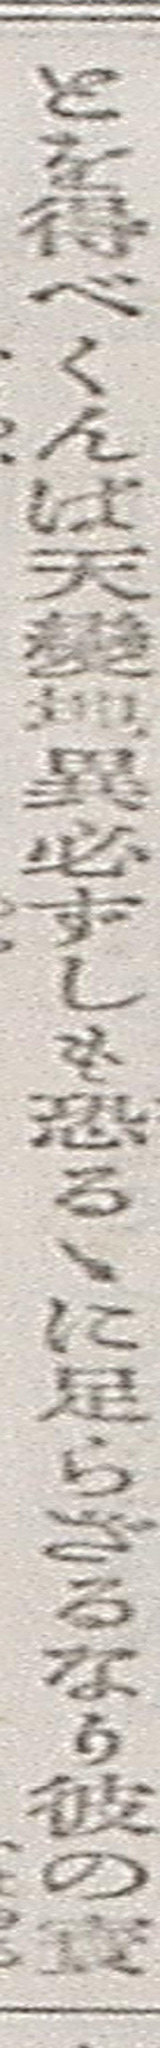とを得べくんば天変地異必ずしも恐るゝに足らざるなり彼の実
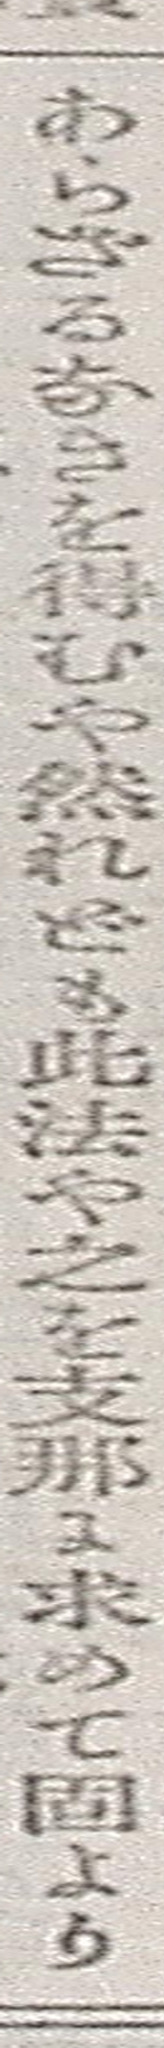あらざるなきを得むや然れども此法や之を支那に求めて固より
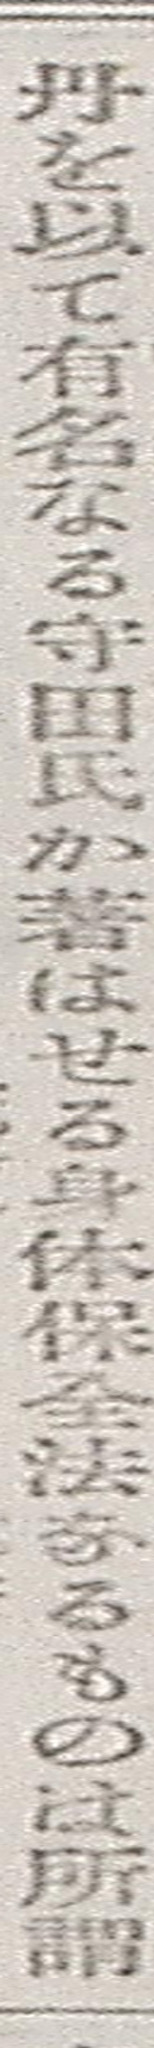丹を以て有名なる守田氏か著はせる身体保全法なるものは所謂
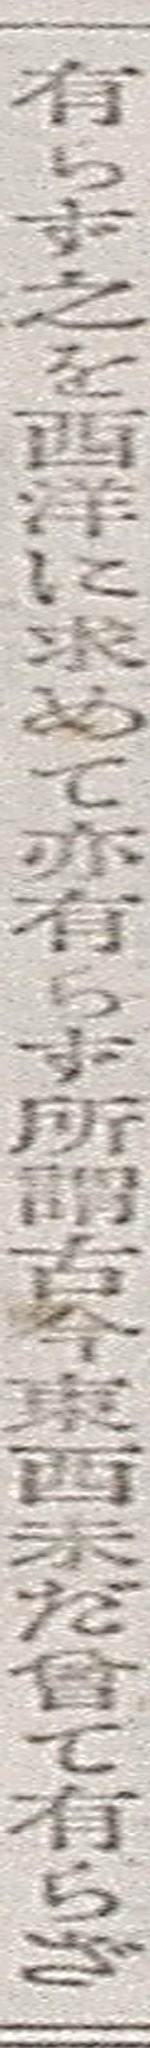有らず之を西洋に求めて亦有らず所謂古今東西未だ曾て有らざ
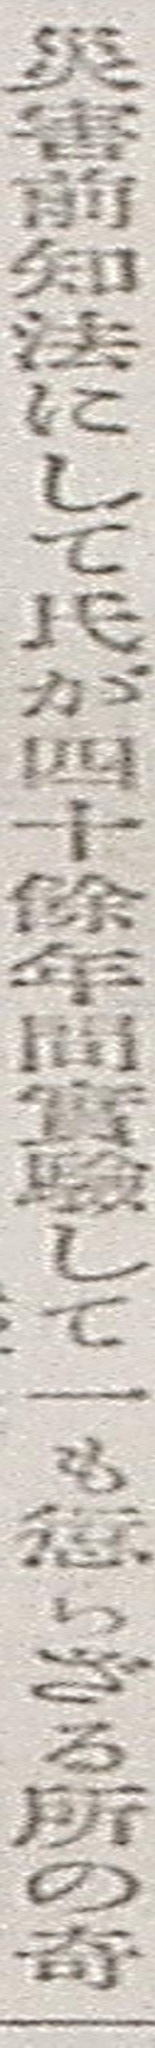災害前知法にして氏が四十余年間実験して一も愆らざる所の奇
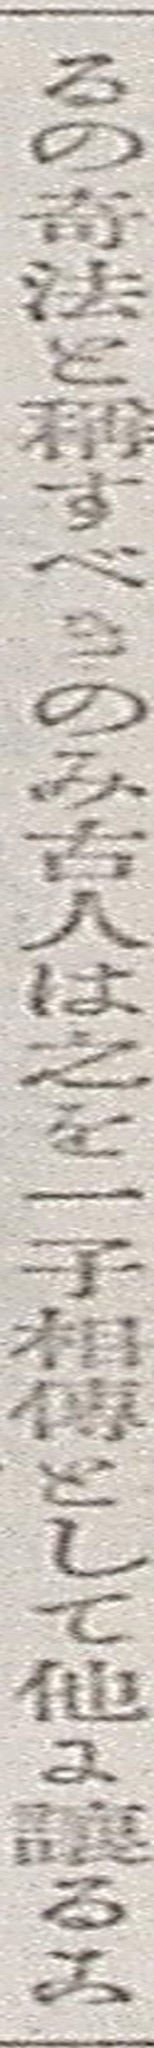るの奇法と稱すべきのみ古人は之を一子相傳として他に讓るこ
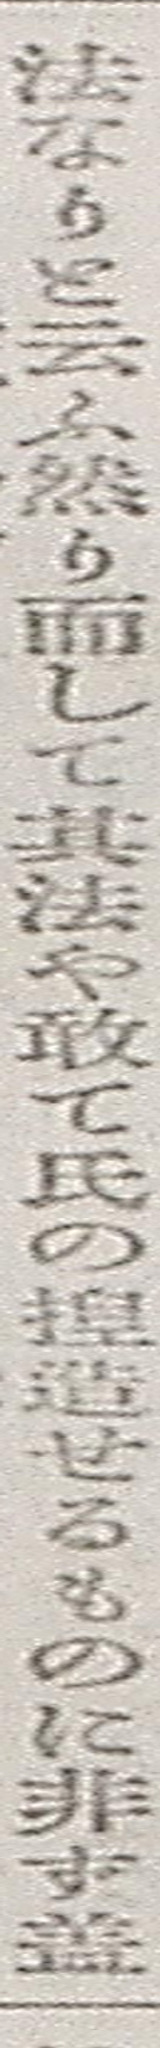法なりと云ふ然り而して其法や敢て氏の捏造せるものに非ず盖
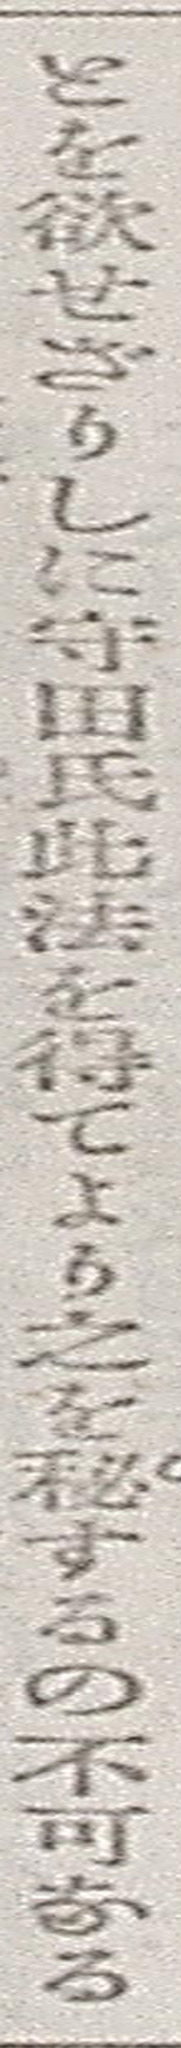とを欲せざりしに守田氏此法を得てより之を秘するの不可なる
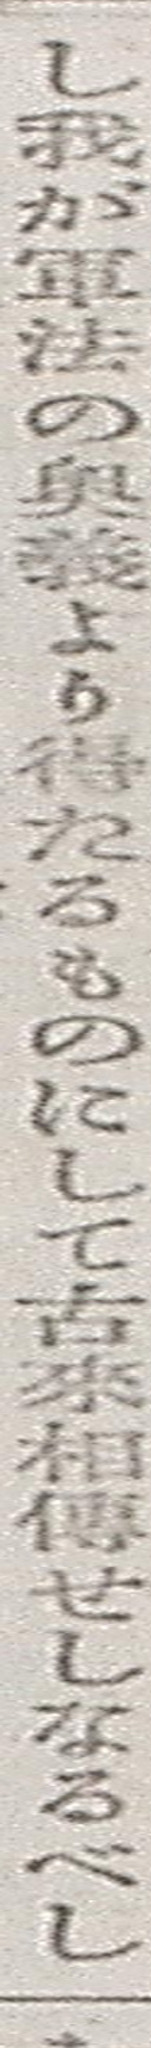し我が軍法の奥義より得たるものにして古来相伝せしなるべし
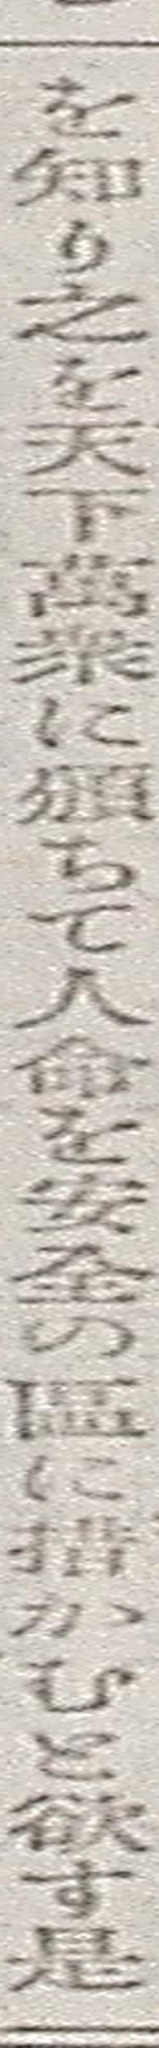を知り之を天下万衆に頒ちて人命を安全の区に惜かむと欲す是
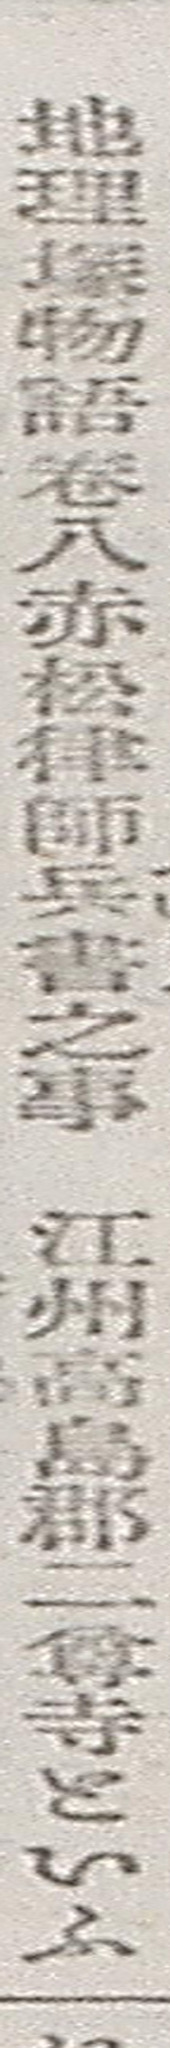地理塚物語巻八赤松律師兵書之事江州高島郡二尊寺といふ
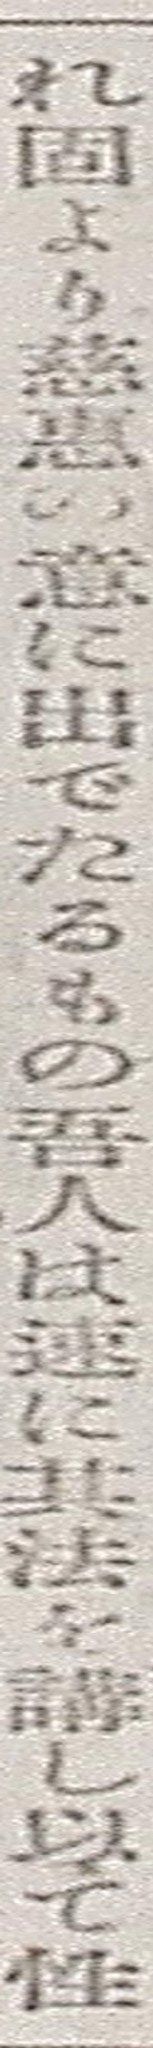れ固より慈恵の意に出たるもの吾人は速に其法を講し以て性
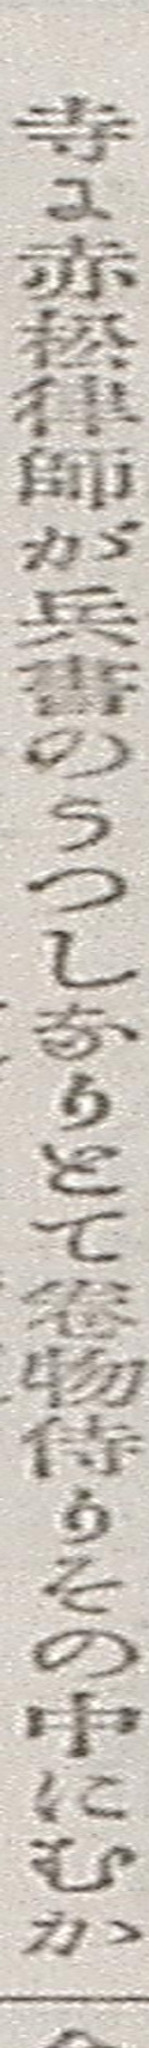寺に赤松律師が兵書のうつしなりとて巻物侍りその中にむか
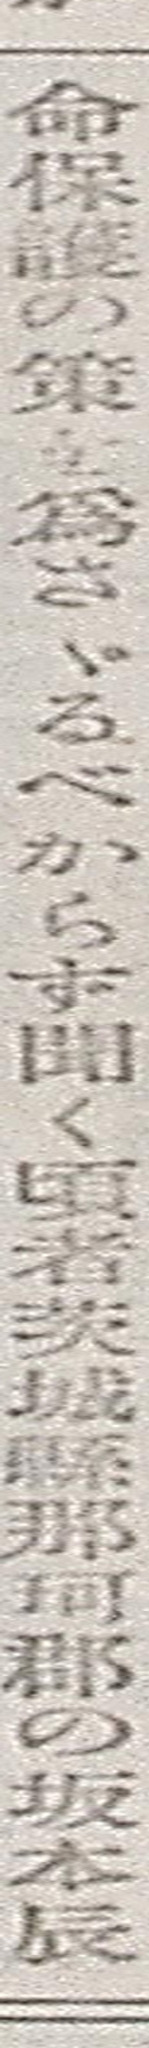命保護の策を為さゞるべからず聞く頃者茨城県那珂郡の坂本辰
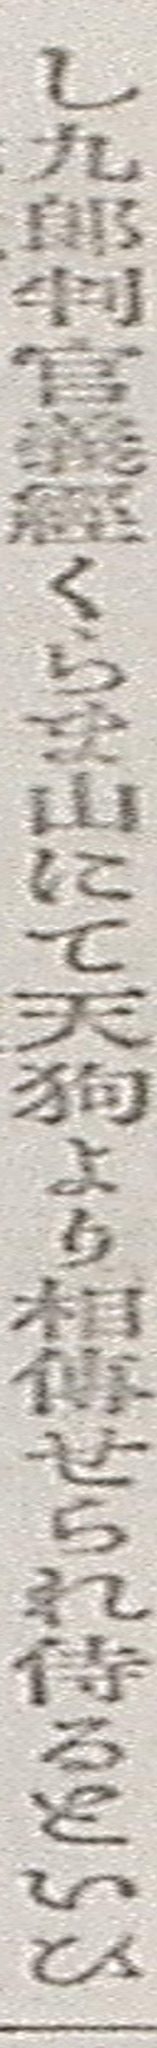し九郎判官義経くらま山にて天狗より相伝せられ侍るといひ
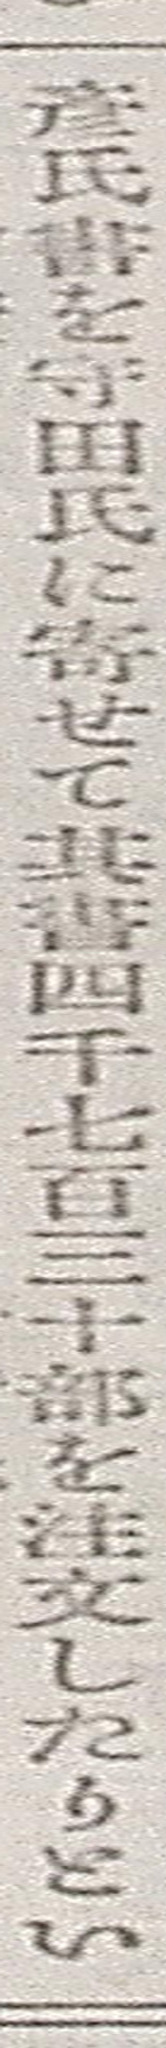彦氏書を守田氏に寄せて其書四千七百三十部を注文したりとい
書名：風俗畫報臨時増刊第百二十號　大海嘯被害録（下）
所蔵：東京大学地震研究所図書室 Earthquake Research Institute Library, The University of Tokyo, JAPAN
